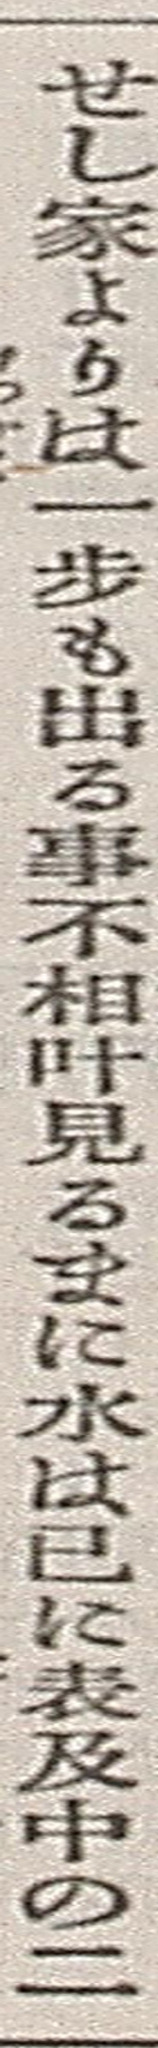せし家よりは一歩も出る事不相叶見るまに水は已に表及中の二
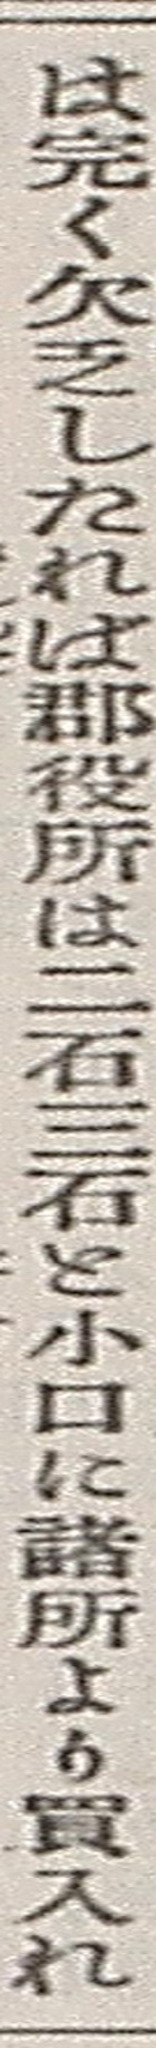は完く欠乏したれば郡役所は二石三石と小口に諸所より買入れ
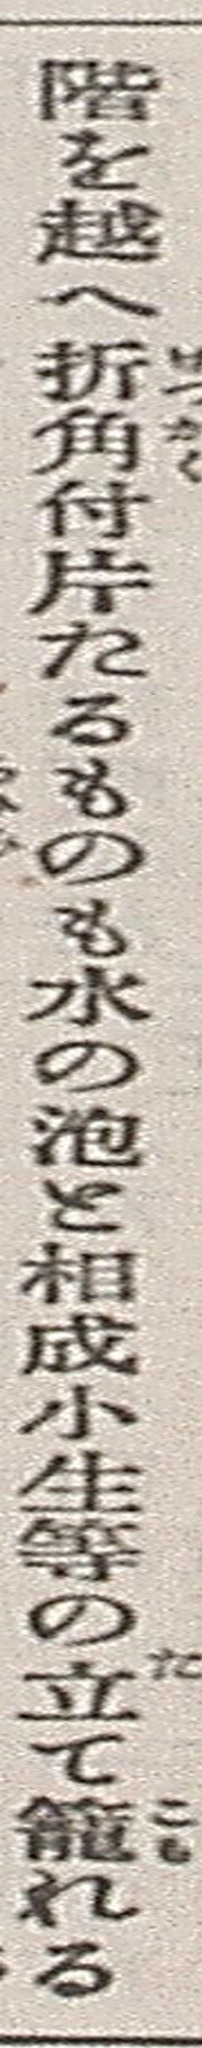階を越へ折角片付たるものも水の泡と相成小生等の立て籠れる
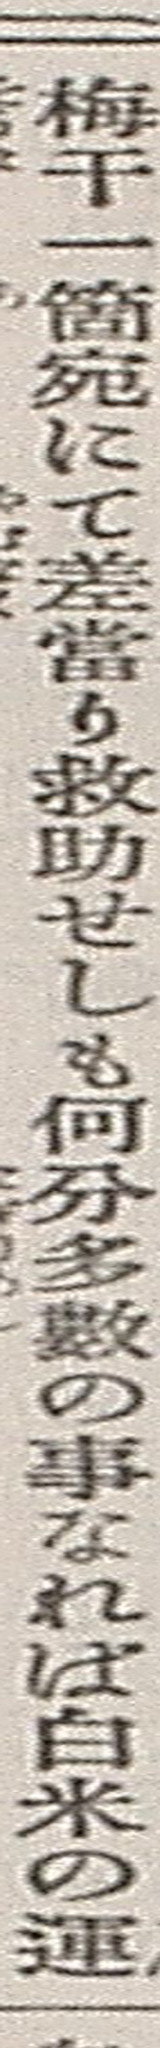梅干一箇宛にて差当り救助せしも何分多数の事なれば白米の運
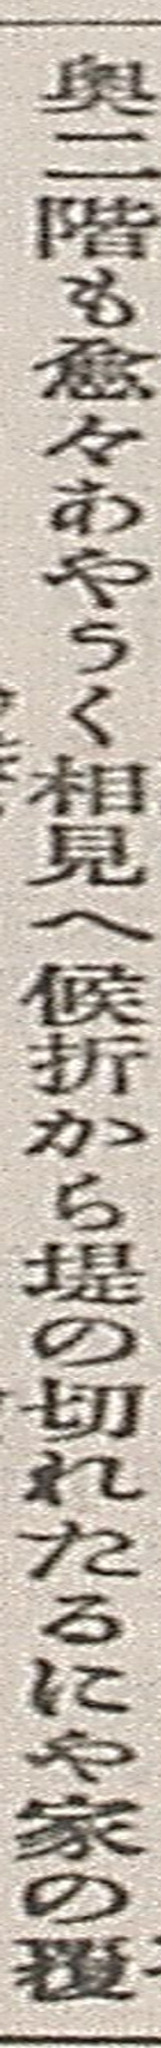奥二階も愈々あやうく相見へ候折から堤の切れたるにや家の覆
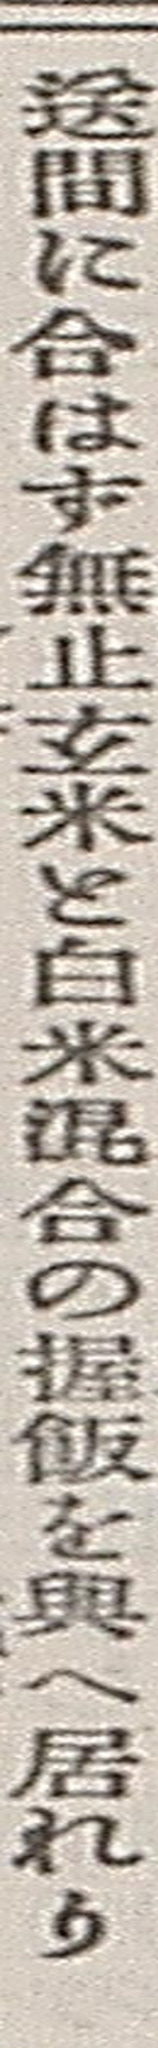送間に合はず無止玄米と白米混合の握飯を與へ居れり
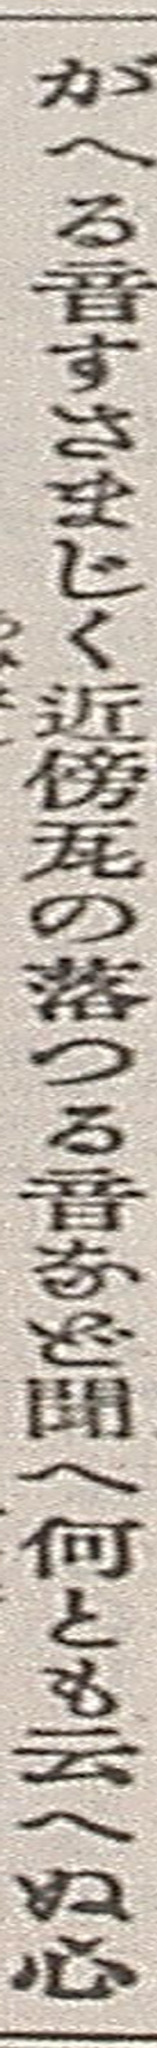がへる音すさまじく近傍瓦の落つる音など聞へ何とも言へぬ心
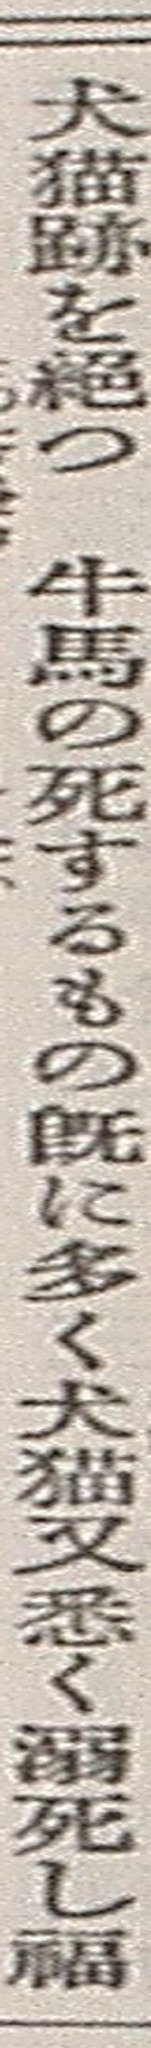犬猫跡を絶つ牛馬の死するもの既に多く犬猫又悉く溺死し福
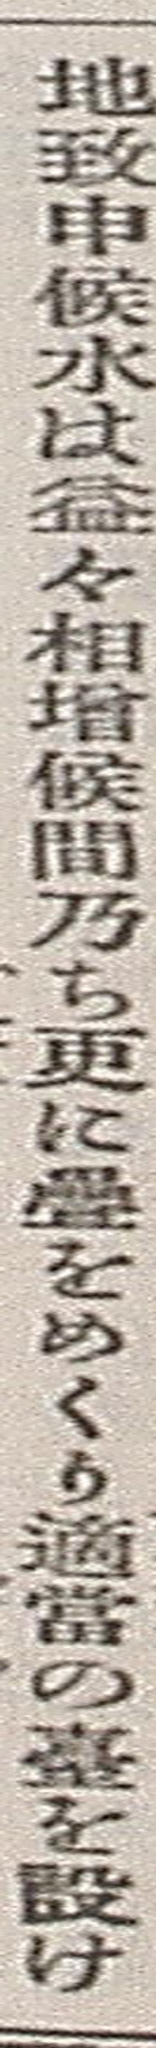地致申候水は益々相増候間乃ち更に畳をめくり適当の台を設け
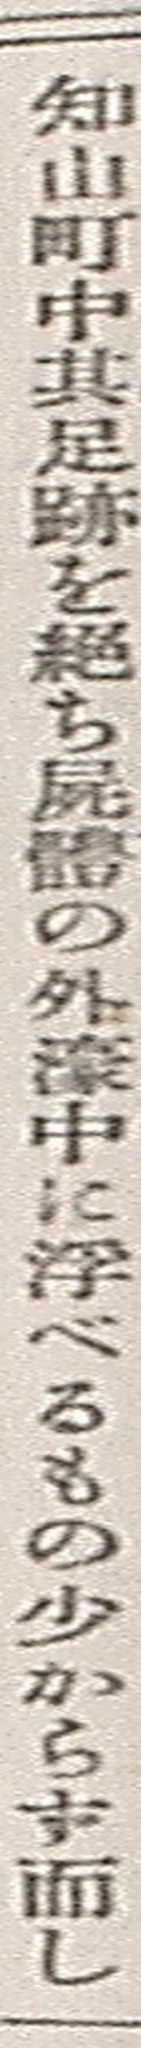知山町中其足跡を絶ち屍体の外濠中に浮べるもの少からず而し
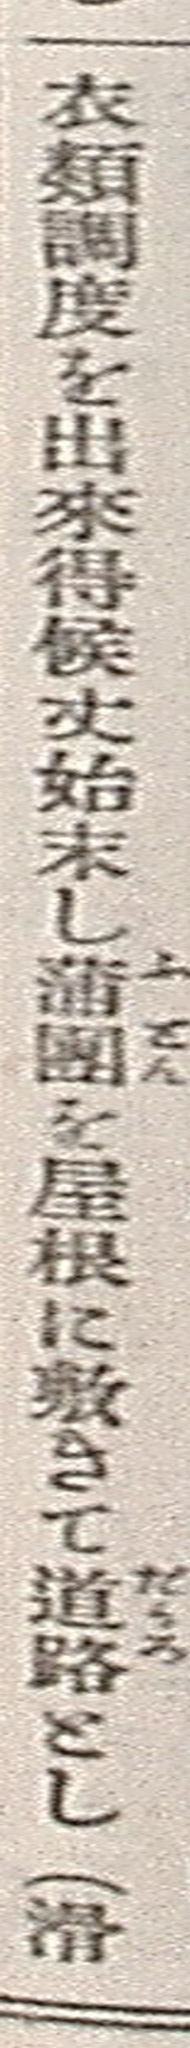衣類調度を出来得候丈始末し蒲団を屋根に敷きて道路とし（滑
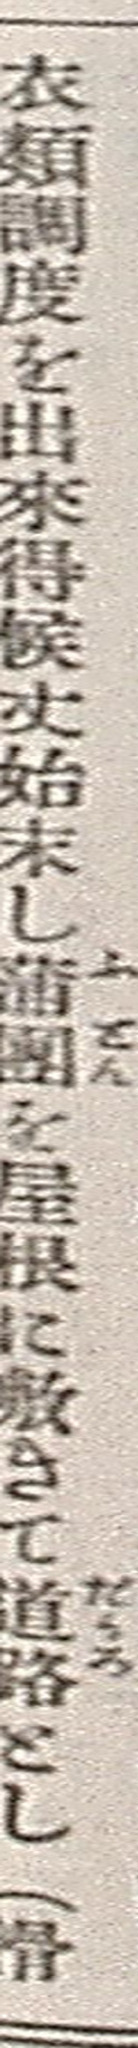衣類調度を出来得候丈始末し蒲団を屋根に敷きて道路とし（滑
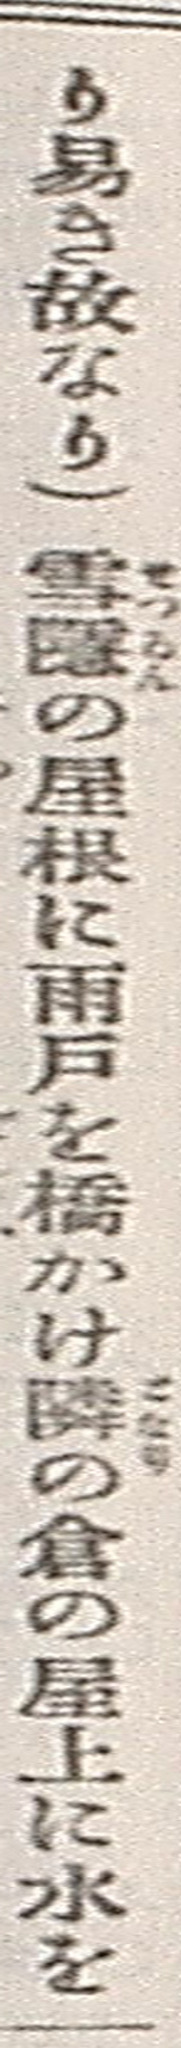り易き故なり）雪隠の屋根に雨戸を橋かけ隣の倉の屋上に水を
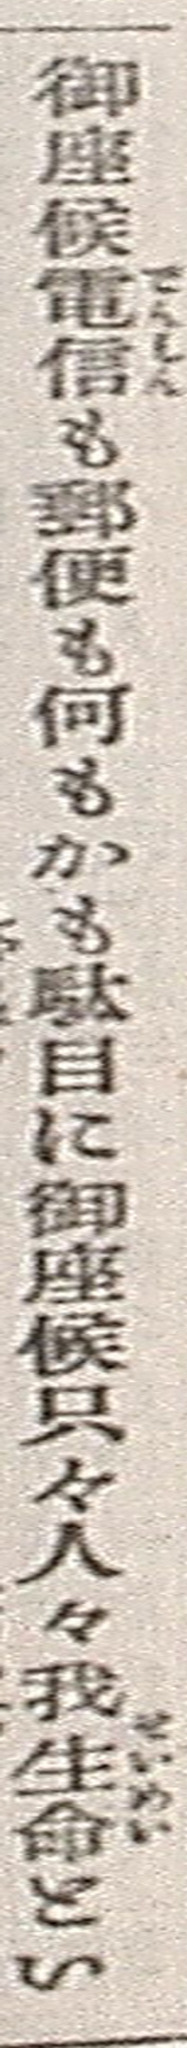御座候電信も郵便も何もかも駄目に御座候只今人々我生命とい
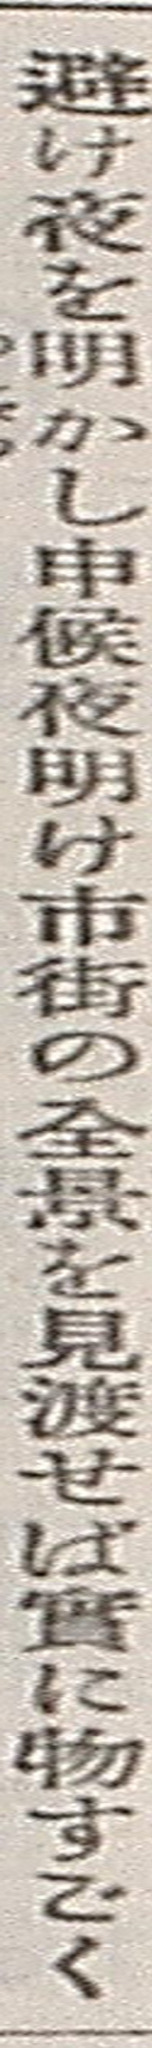避け夜を明かし申候夜明け市街の全景を見渡せば実に物すごく
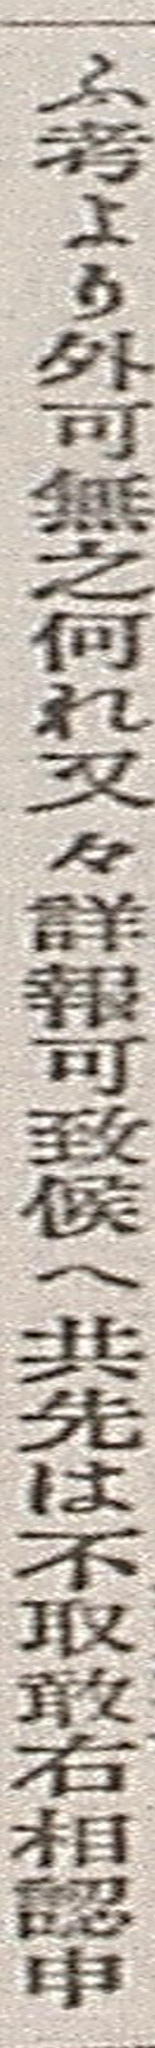ふ考へより外可無之何れ又々詳報可致候へ共先は不取敢右相認申
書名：風俗畫報臨時増刊第百二十六號　洪水被害録（中）
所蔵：東京大学地震研究所図書室 Earthquake Research Institute Library, The University of Tokyo, JAPAN
